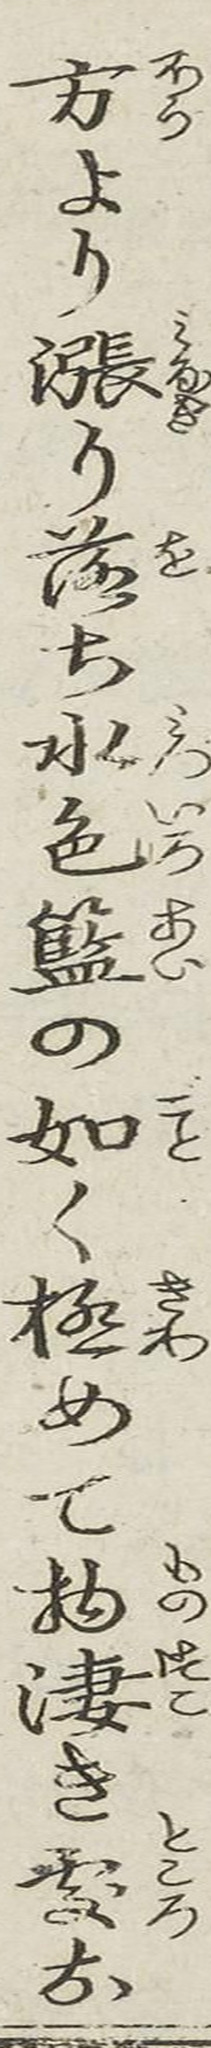方より漲り落ち水色藍の如く極めて物凄き處な
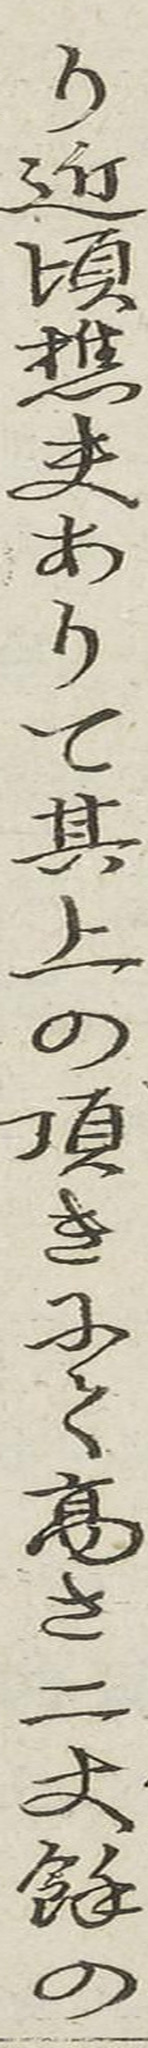り近頃樵夫ありて其上の頂きにて高さ二丈餘の
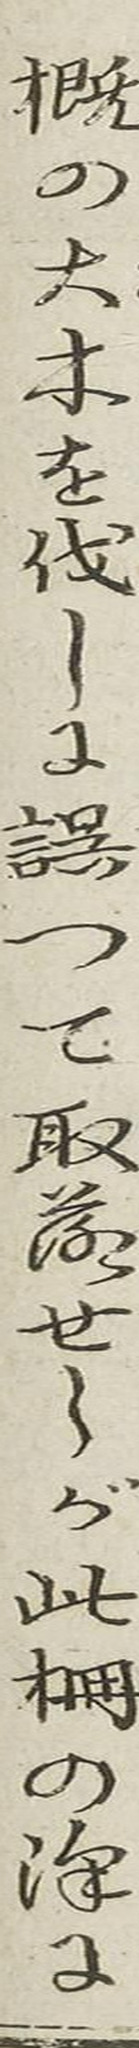概の大木を伐しに誤つて取落せしが此柵の澤に
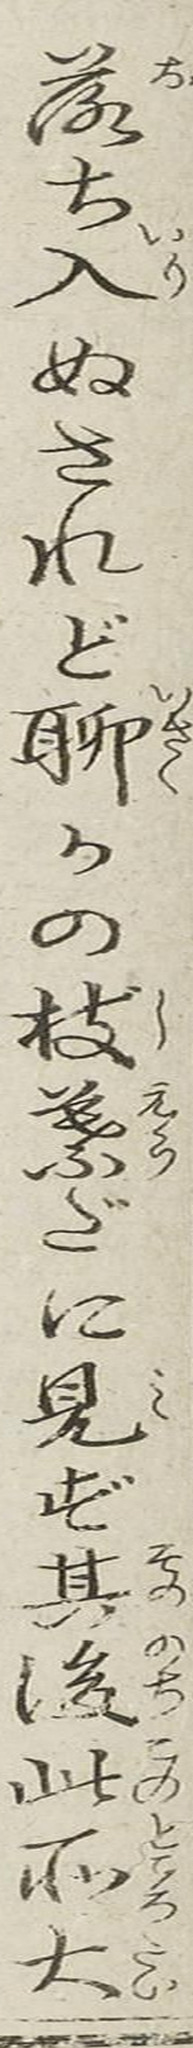落ち入ぬされど聊かの枝葉だに見ず其後此所大
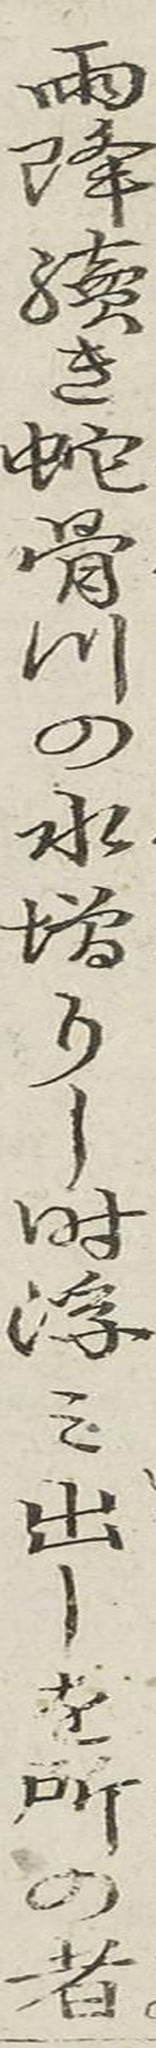雨降続き蛇骨川の水増りし時浮み出しを所の者
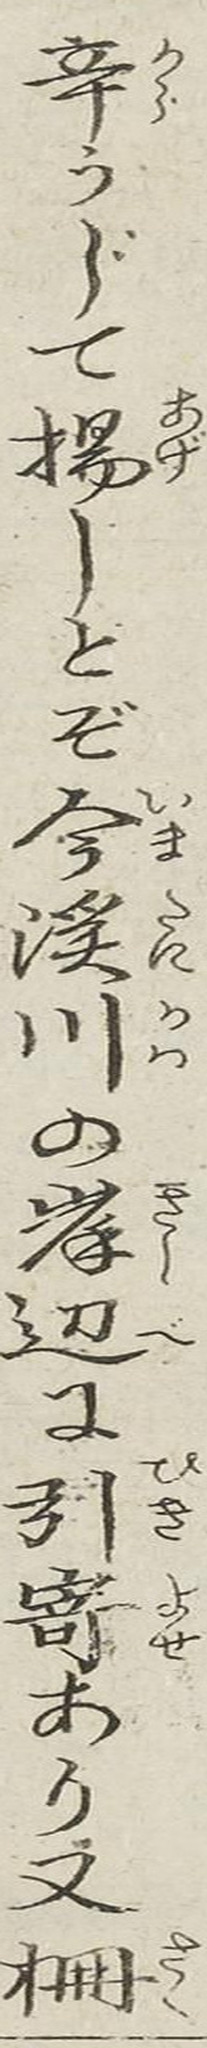辛うじて揚しとぞ今溪川の岸辺に引寄あり又柵
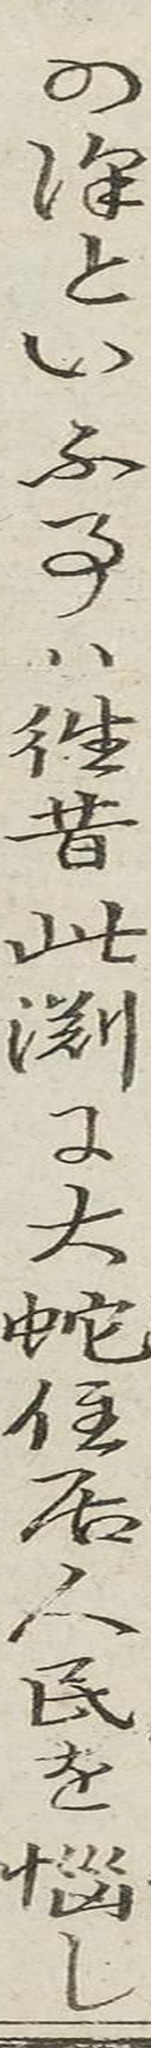の澤といふ事は往昔此渕に大蛇住居人民を悩し
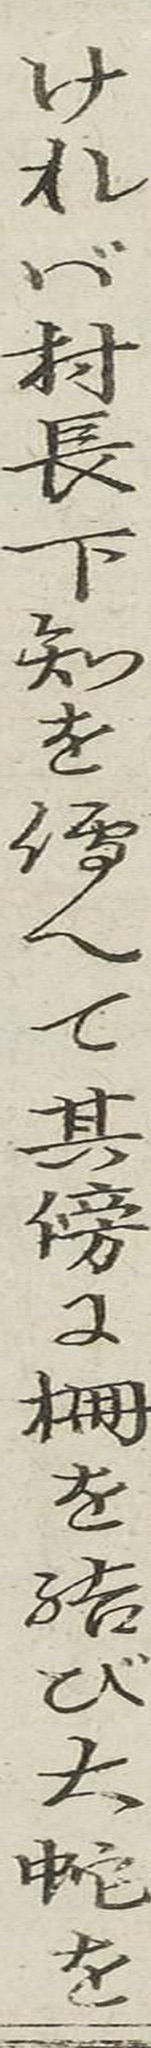ければ村長下知を伝へて其傍に柵を結び大蛇を
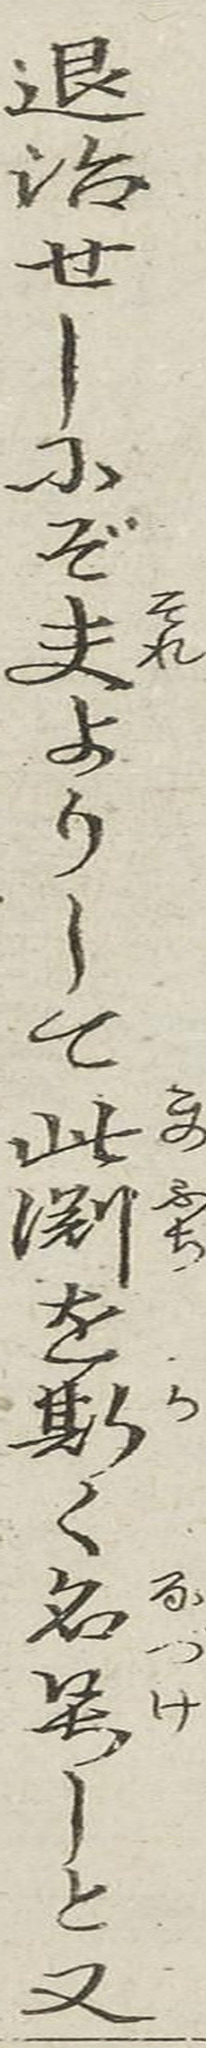退治せしにぞ夫よりして此渕を斯く名号しと又
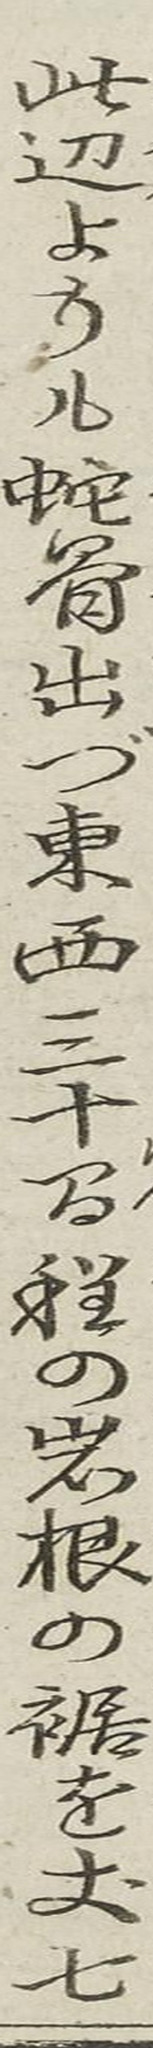此辺よりも蛇骨出づ東西三十間程の岩根の裾を丈七
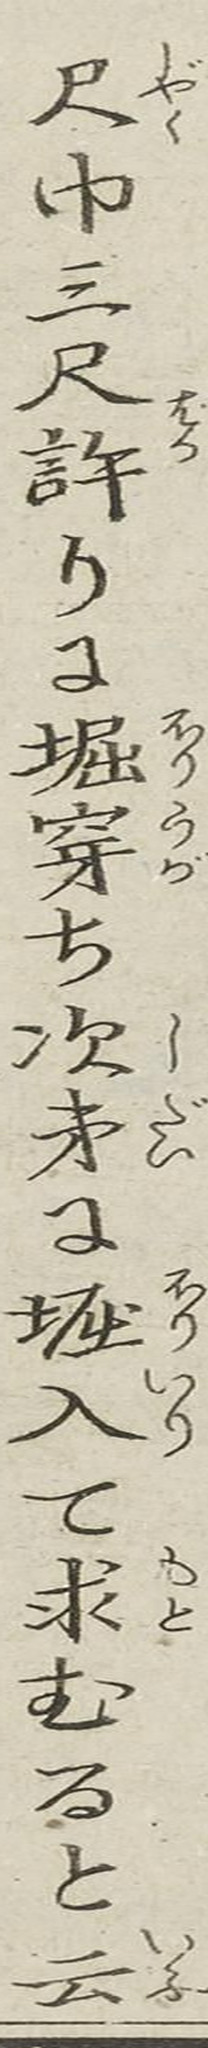尺巾三尺許りに堀穿ち次第に堀入て求むると云
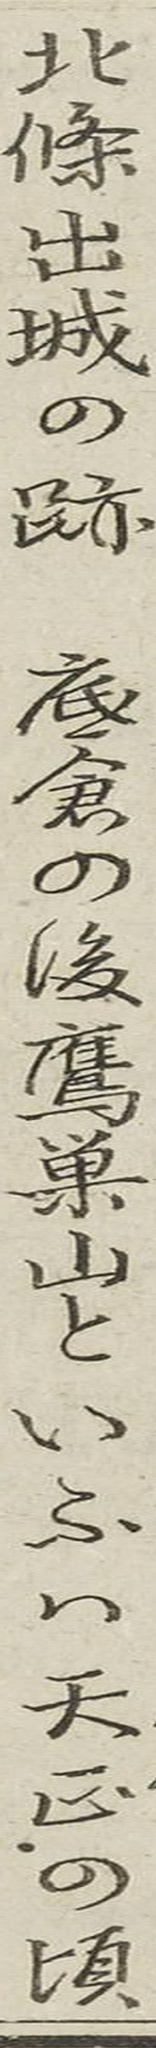北條出城の跡底倉の後鷹巣山といふは天正の頃
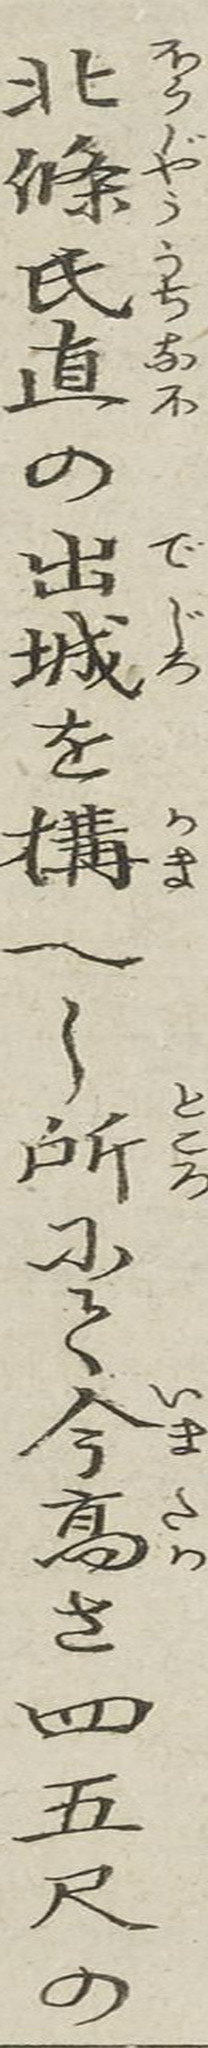北條氏直の出城を構へし所にて今高さ四五尺の

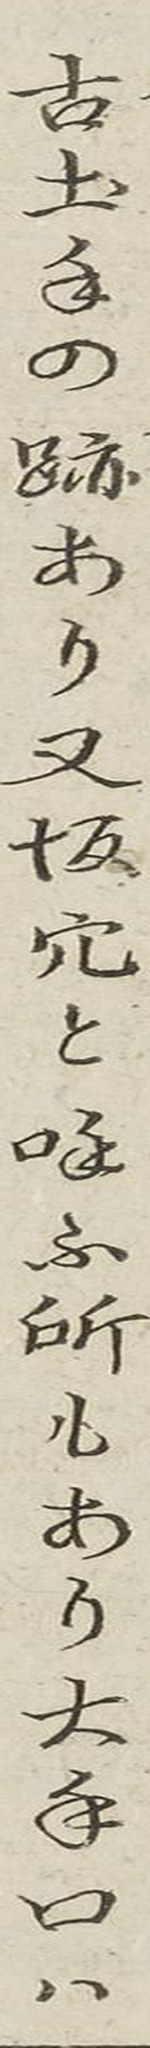古土手の跡あり又坂穴と呼ふ所もあり大手口は
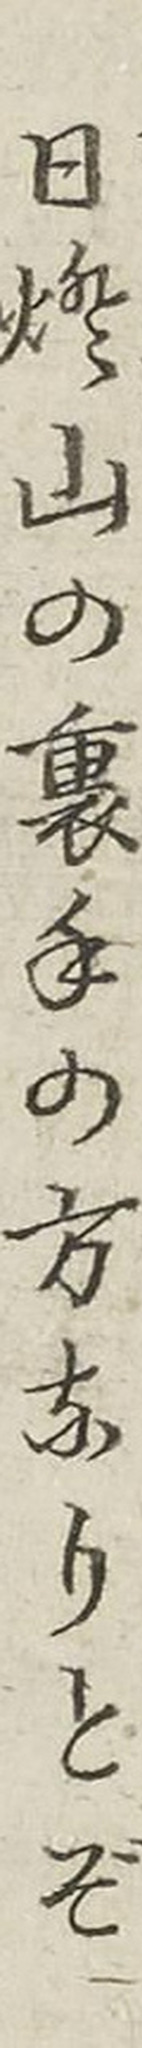日燈山の裏手の方なりとぞ
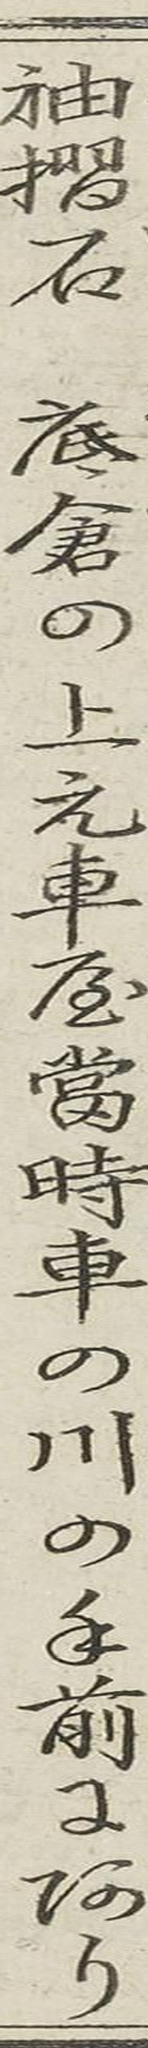袖摺石底倉の上元車屋当時車の川の手前にあり
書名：箱根温泉誌　全
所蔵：東京大学地震研究所図書室 Earthquake Research Institute Library, The University of Tokyo, JAPAN
